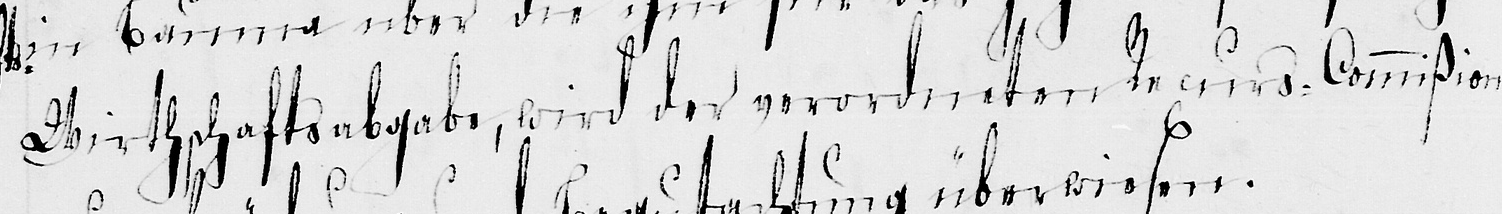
Wirthschaftsabgabe, wird der verordneten Recurs-Commißion
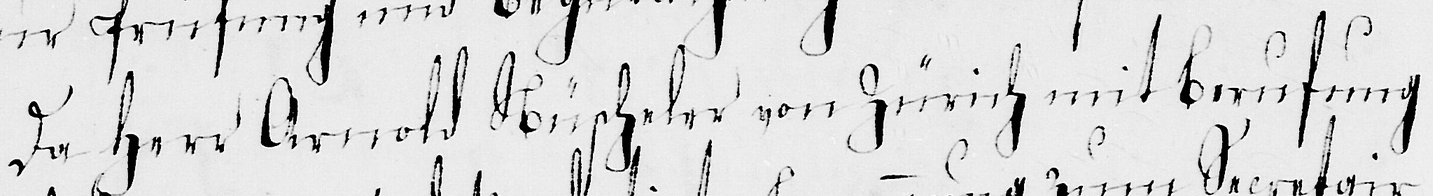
Da Herr Arnold Nüscheler von Zürich mit Berufung
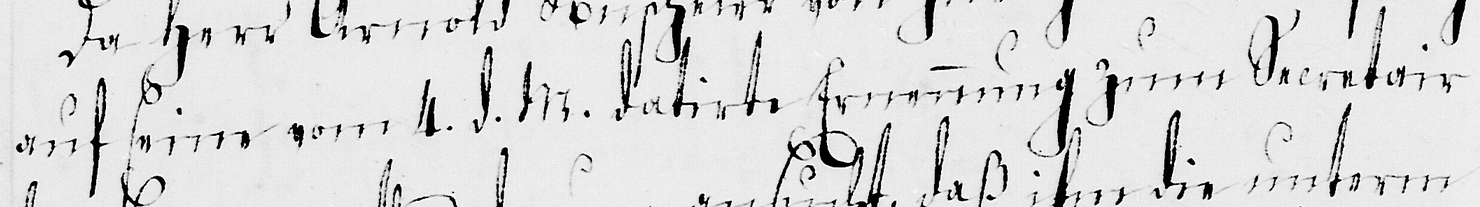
auf seine vom 4. d. M. datirte Ernennung zum Secretair
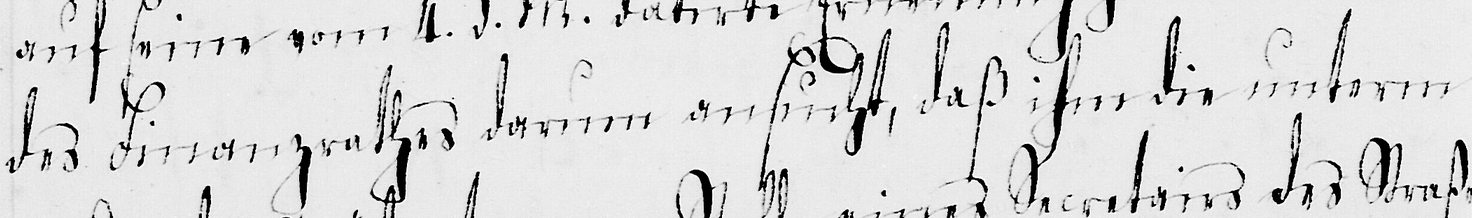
des Finanzrathes darum ansucht, daß ihm die unterm
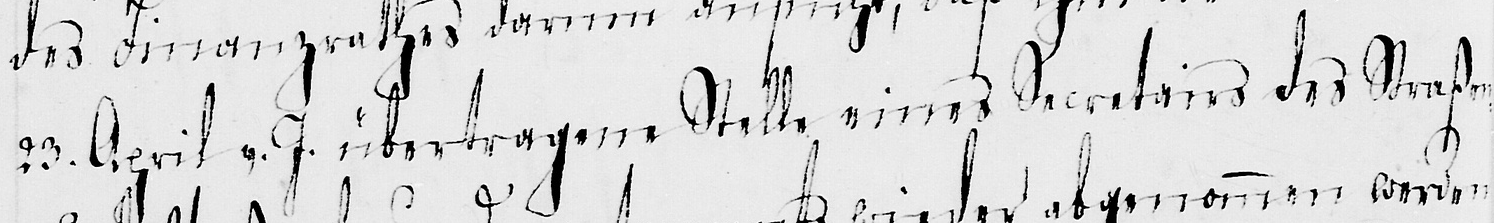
23. April v. J. übertragene Stelle eines Secretairs des Straßen-
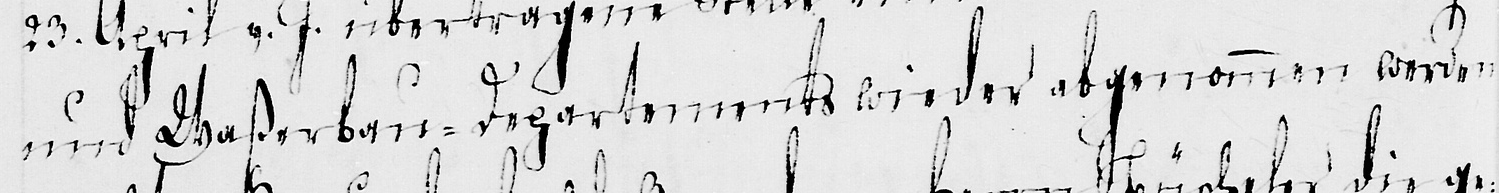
und Waßerbau-Departements wieder abgenommen werden
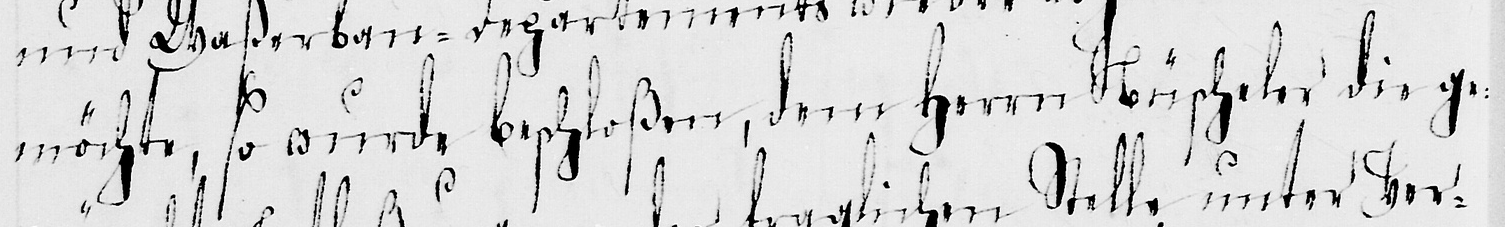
möchte, so wurde beschloßen, dem Herrn Nüscheler die ge¬
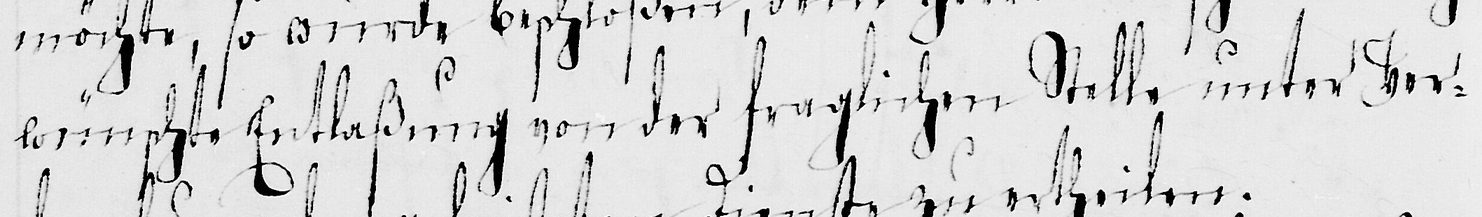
wünschte Entlaßung von der fraglichen Stelle unter Ver¬
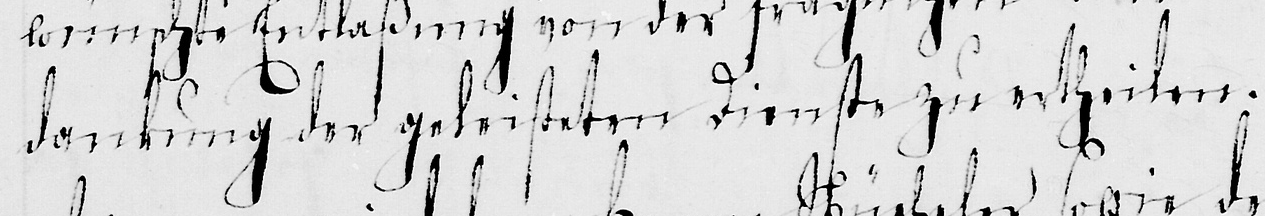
dankung der geleisteten Dienste zu ertheilen:
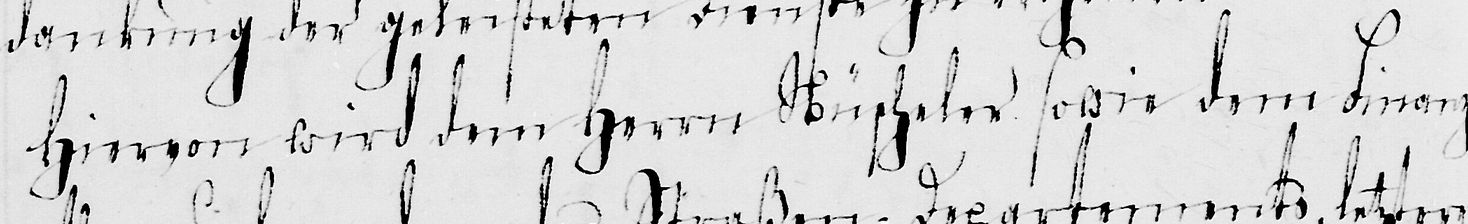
Hiervon wird dem Herrn Nüscheler sowie dem Finan¬
